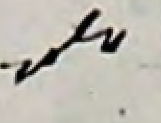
Do
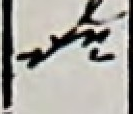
Do
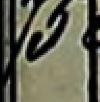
75
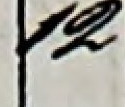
12
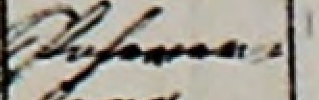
Pose???
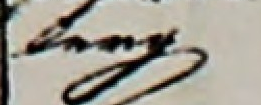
berg
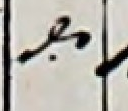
Do
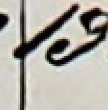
13
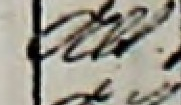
Alt
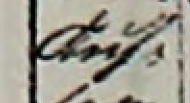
Aus„
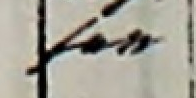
see
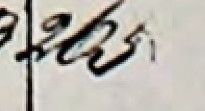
265
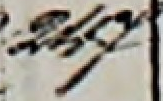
247
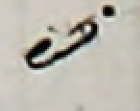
5
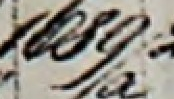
1689/a
